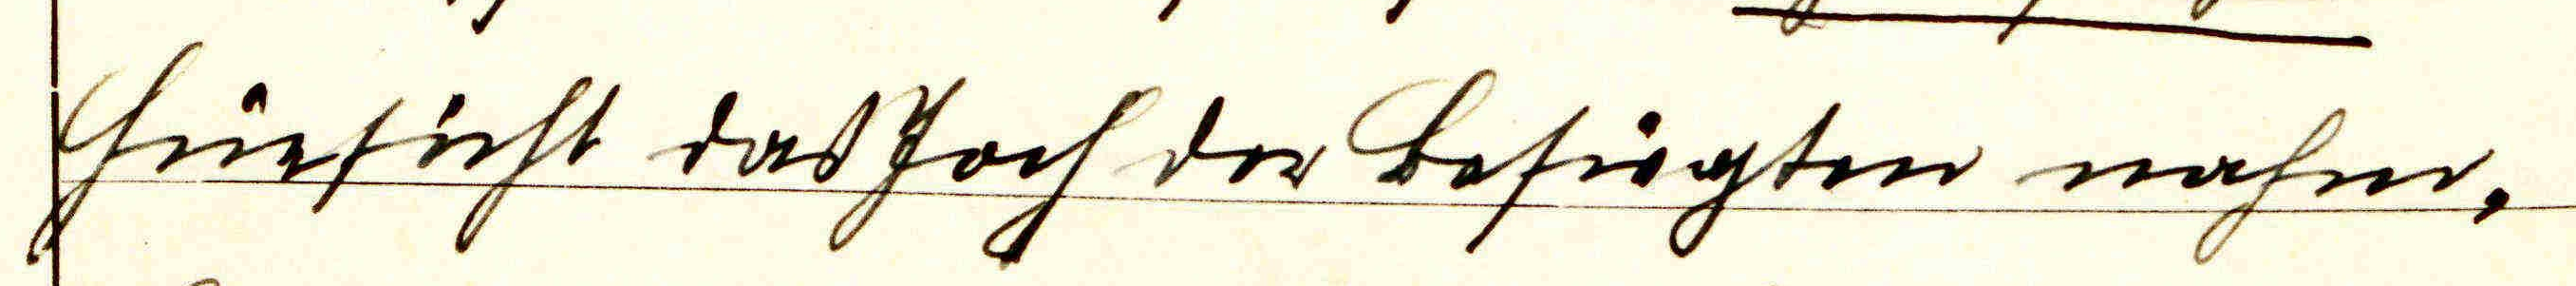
Hinsicht das Joch der Besiegten nahm,
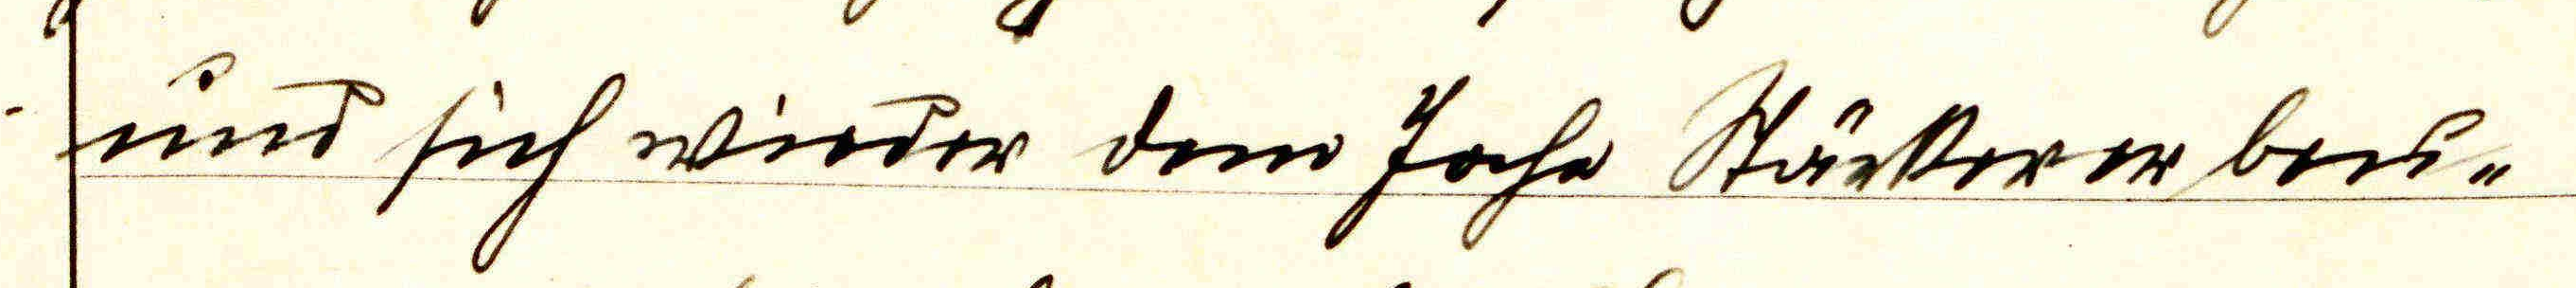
und sich wieder dem Joche Stärkerer beu-
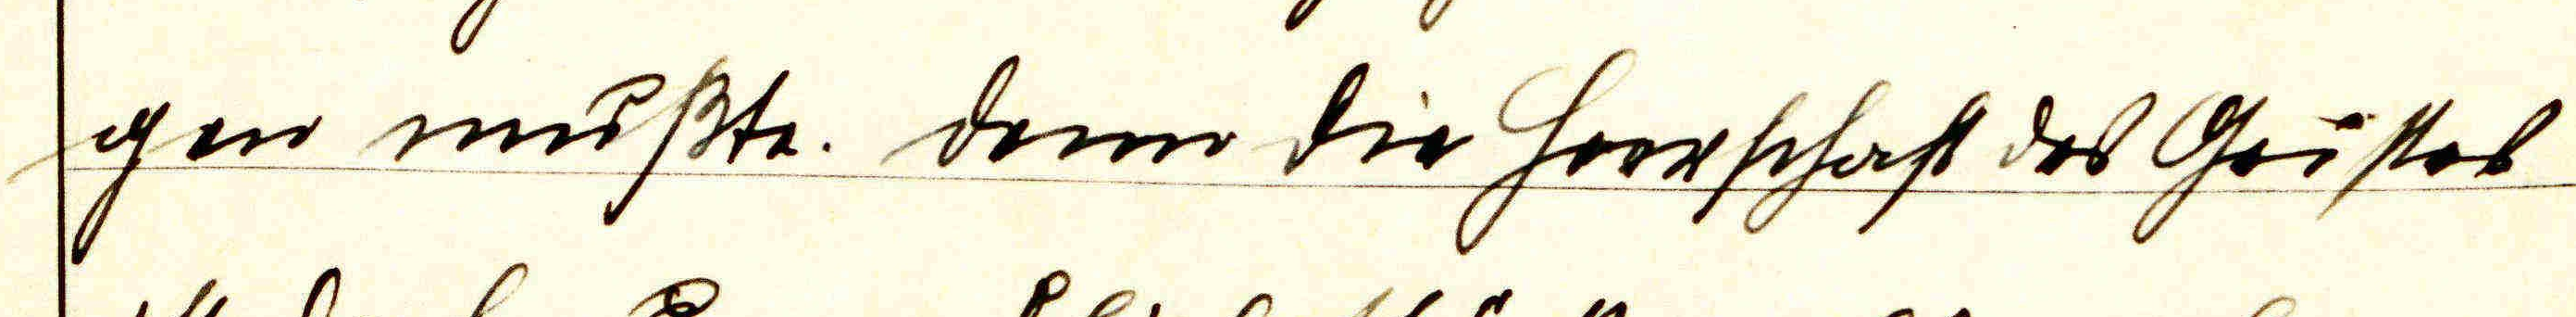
gen mußte. Denn die Herrschaft des Geistes
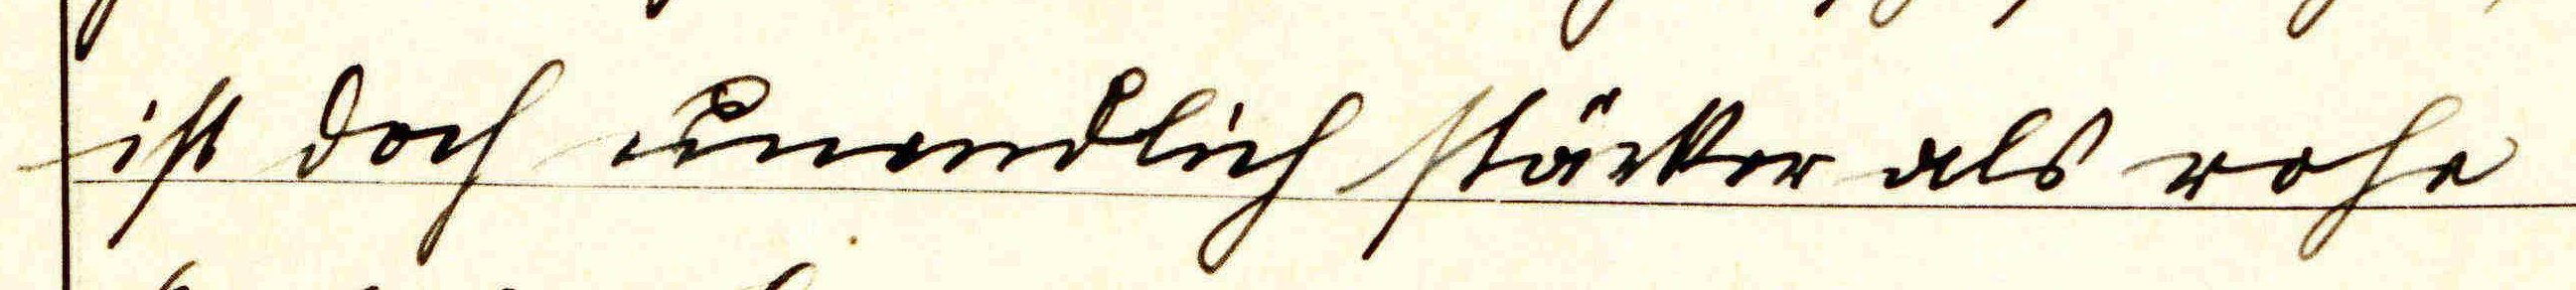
ist doch unendlich stärker als rohe
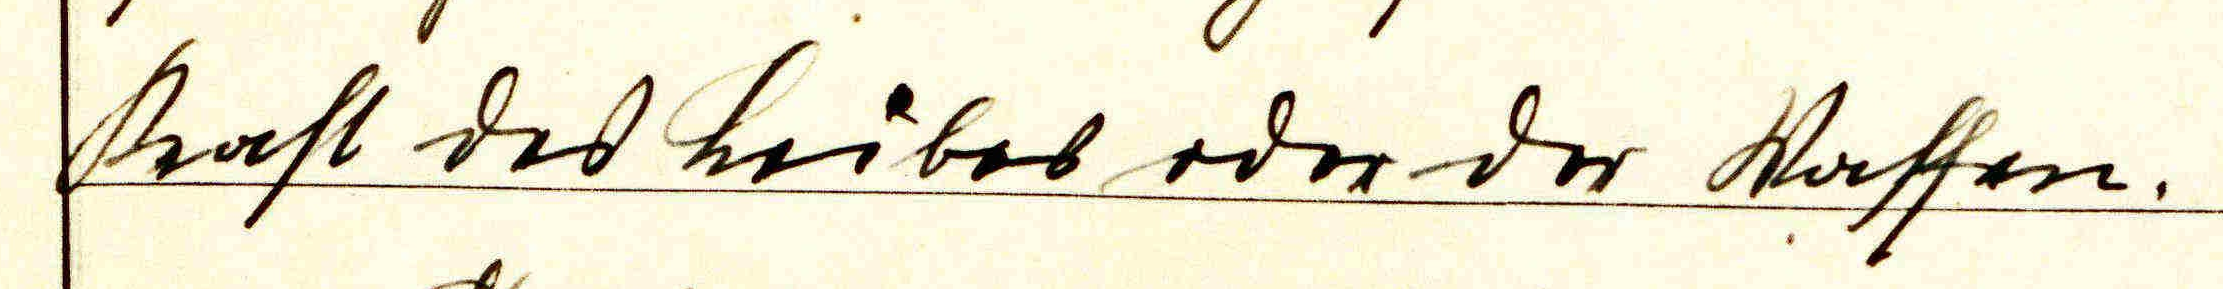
Kraft des Leibes oder der Waffen.
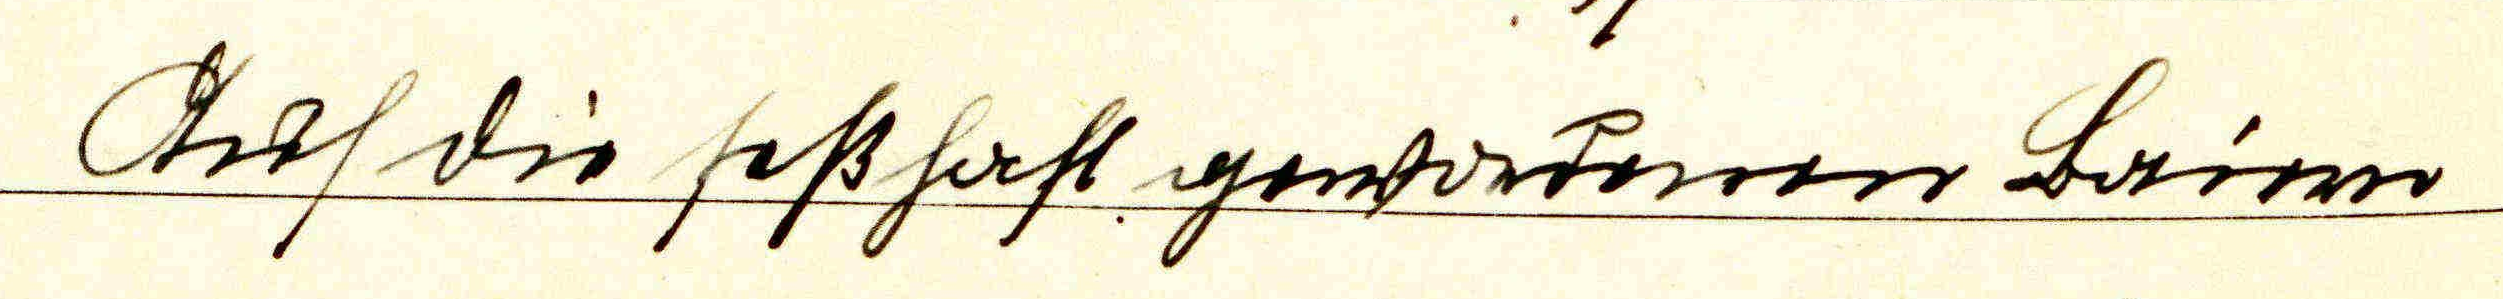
Auf die seßhaft gewordenen Baiern
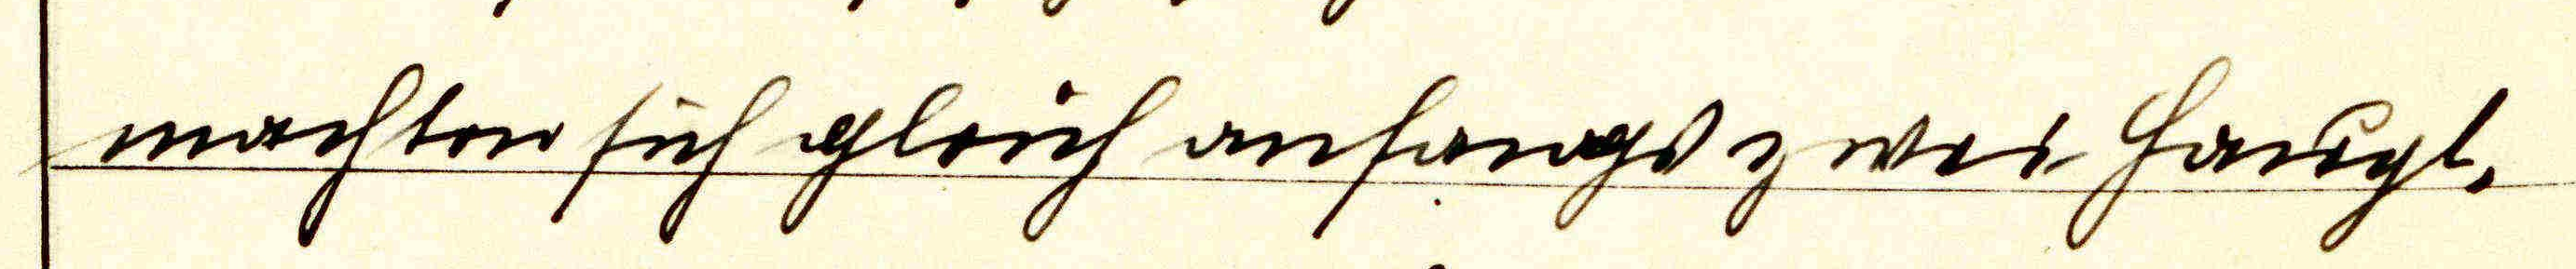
machten sich gleich anfangs zwei Haupt-
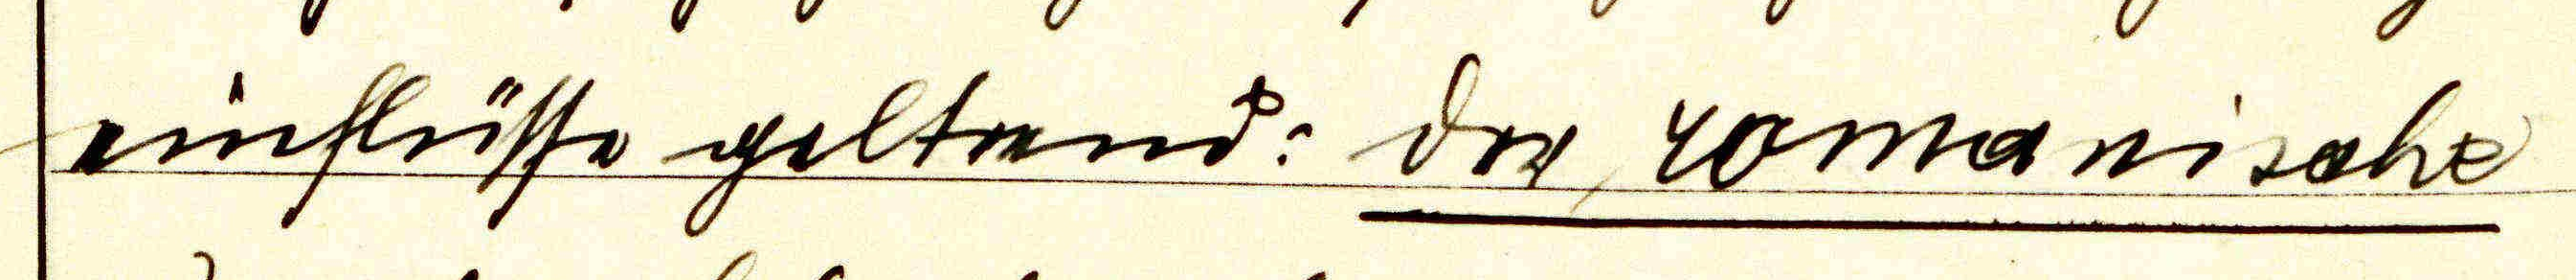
einflüsse geltend: der, romanische
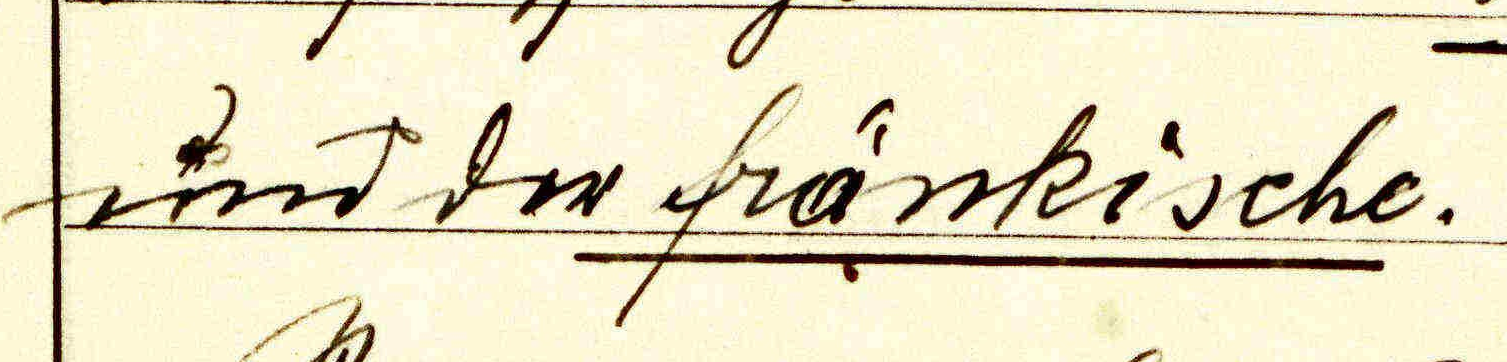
und der fränkische.
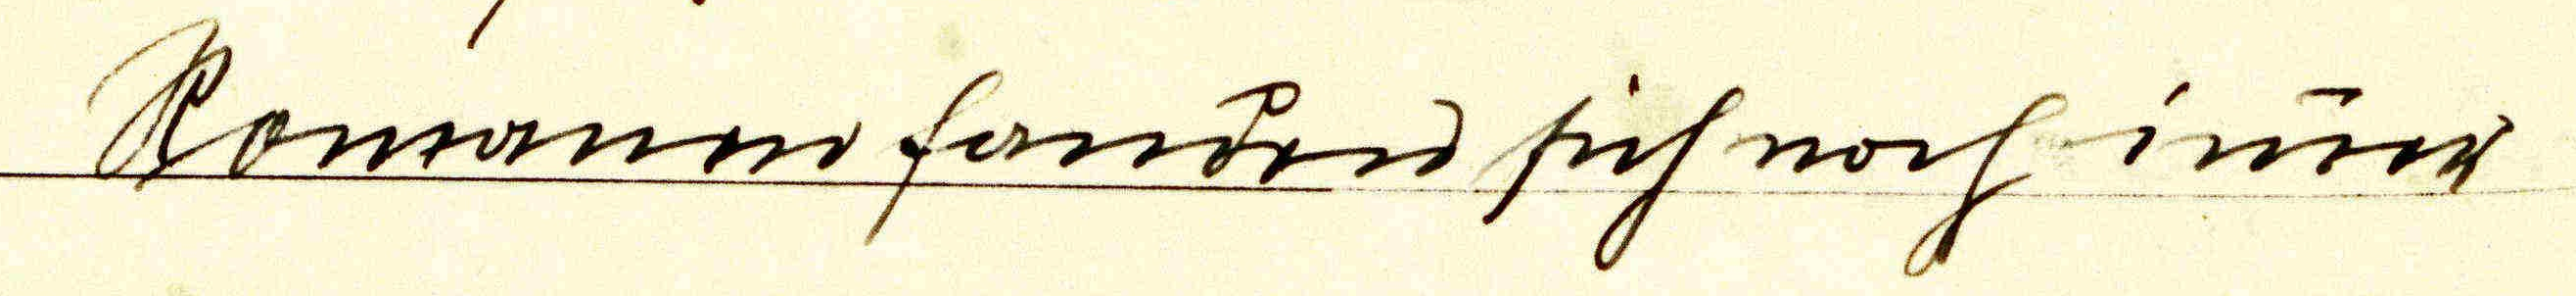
Romanen fanden sich noch immer
